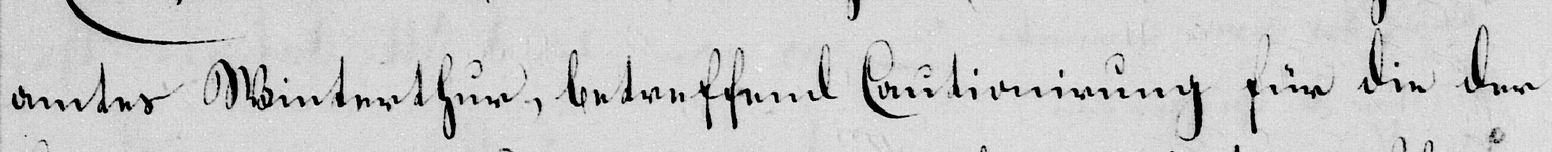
amtes Winterthur, betreffend Cautionirung für die der
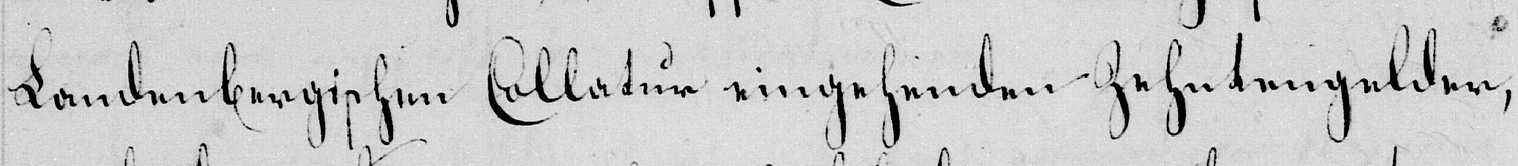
Landenbergischen Collatur eingehenden Zehntengelder,
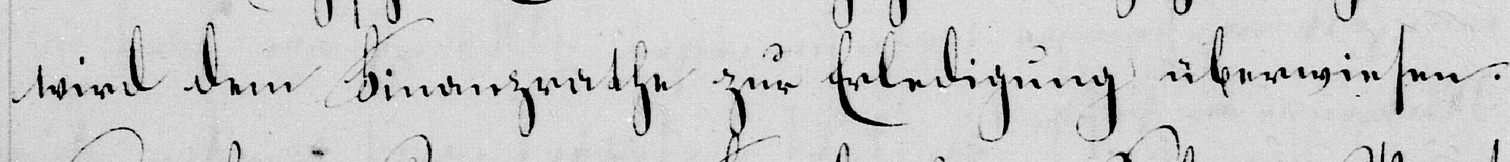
wird dem Finanzrathe zur Erledigung überwiesen.
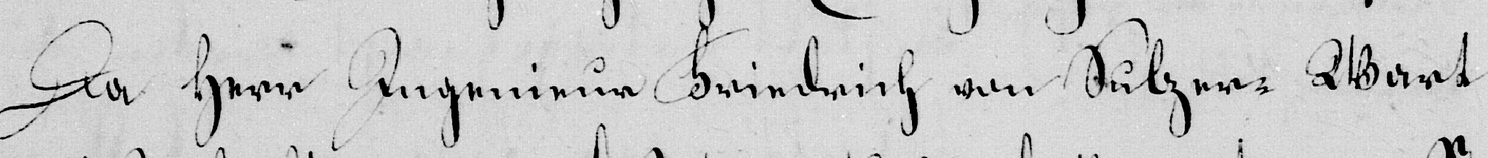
Da Herr Ingenieur Friedrich von Sulzer-Wart
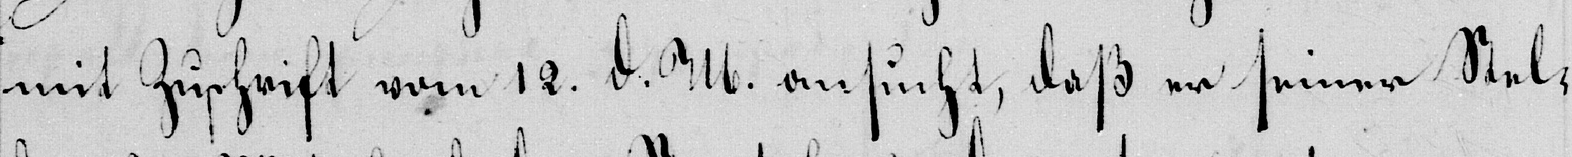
mit Zuschrift vom 12. d. M. ansucht, daß er seiner Stel¬
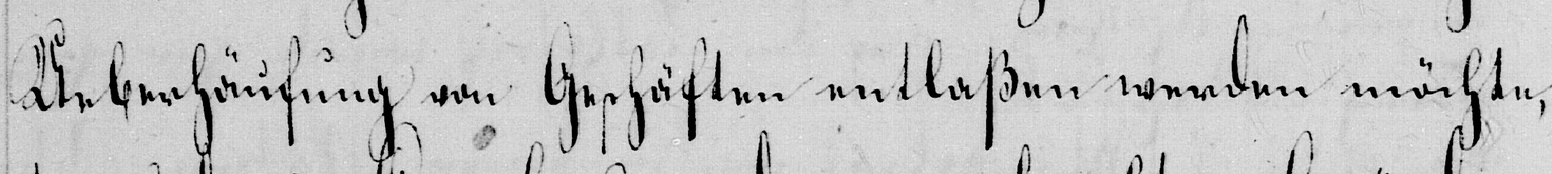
Ueberhäufung von Geschäften entlaßen werden möchte,
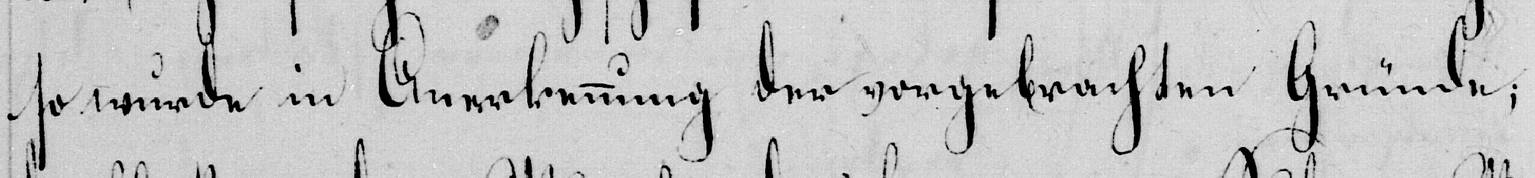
so wurde in Anerkennung der vorgebrachten Gründe;
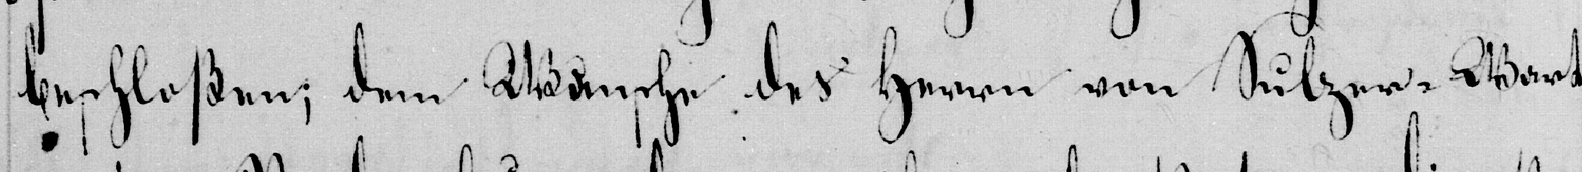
beschloßen; dem Wunsche des Herrn von Sulzer-Wart
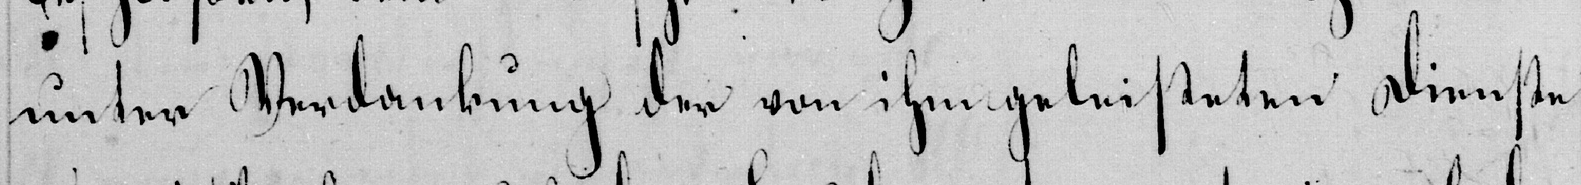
unter Verdankung der von ihm geleisteten Dienste
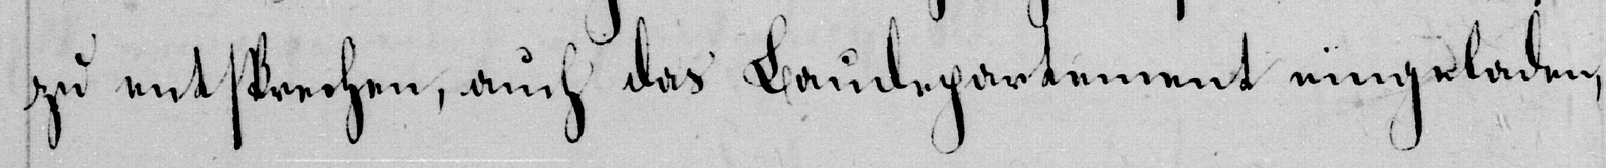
zu entsprechen, auch das Baudepartement eingeladen,
